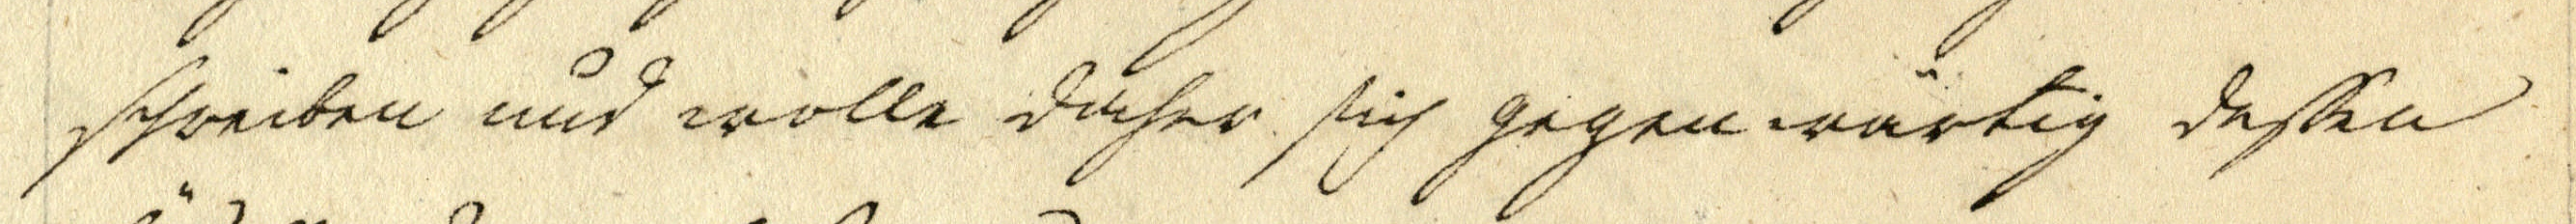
schreiben und wolle daher sich gegenwärtig dessen
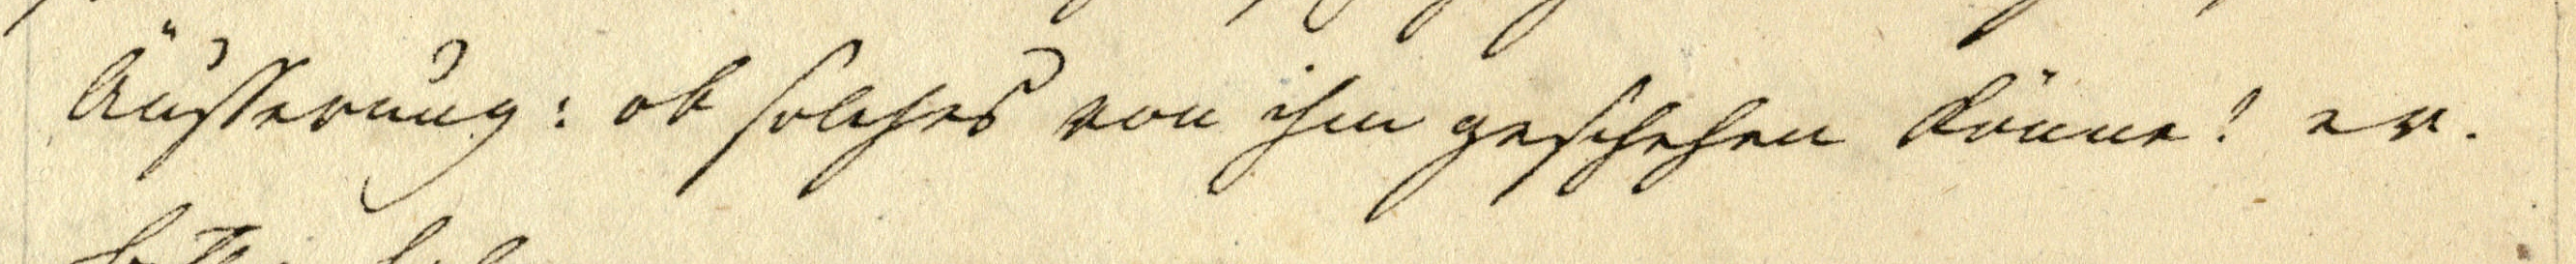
Äusserung: ob solches von ihm geschehen könne? er¬
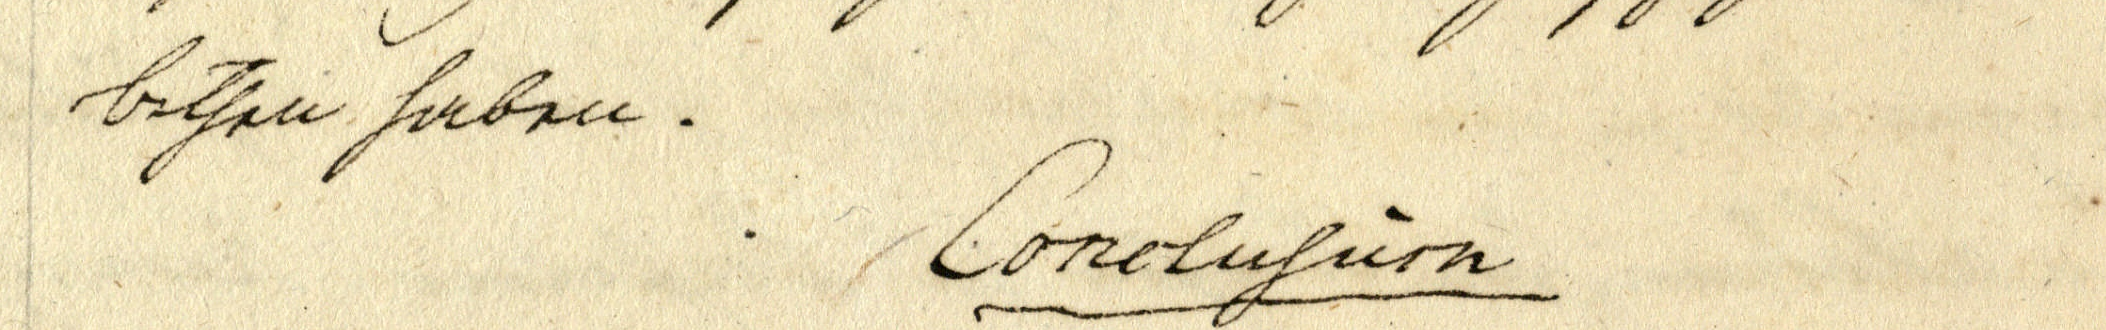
bethen haben.
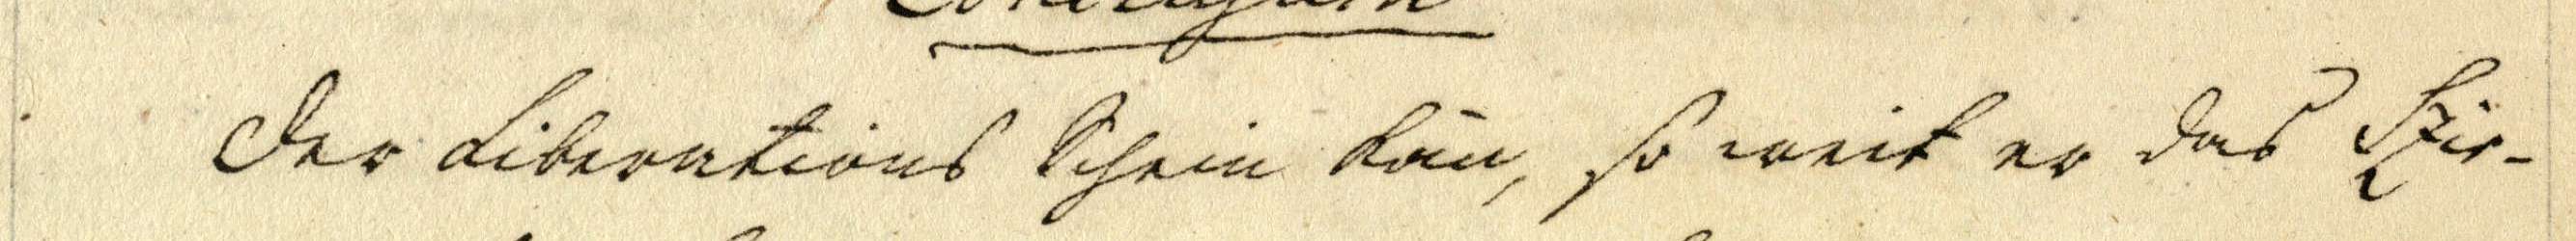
Der Librations Schein kan, soweit er das Szir¬
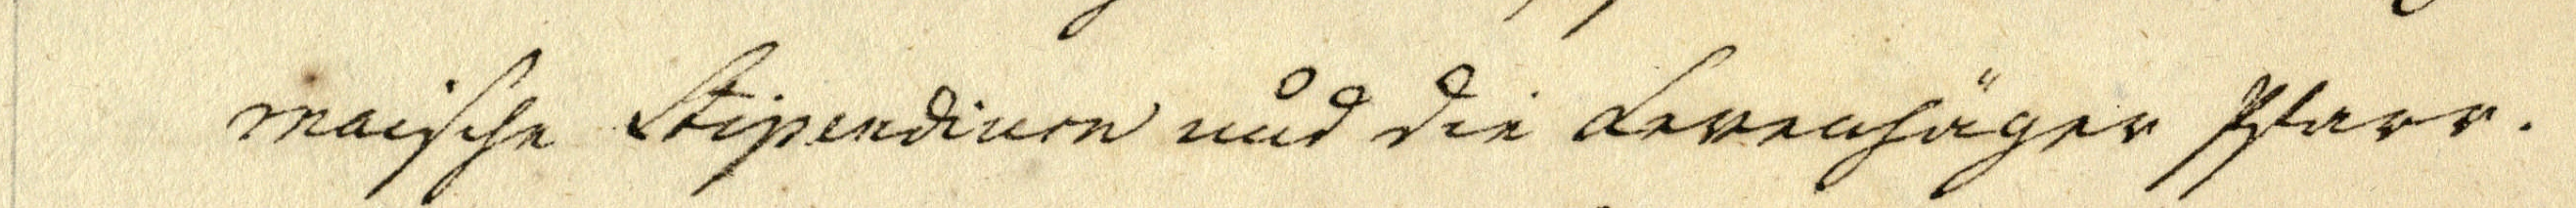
maische Stipendium und die Levenhäger Pfarr¬
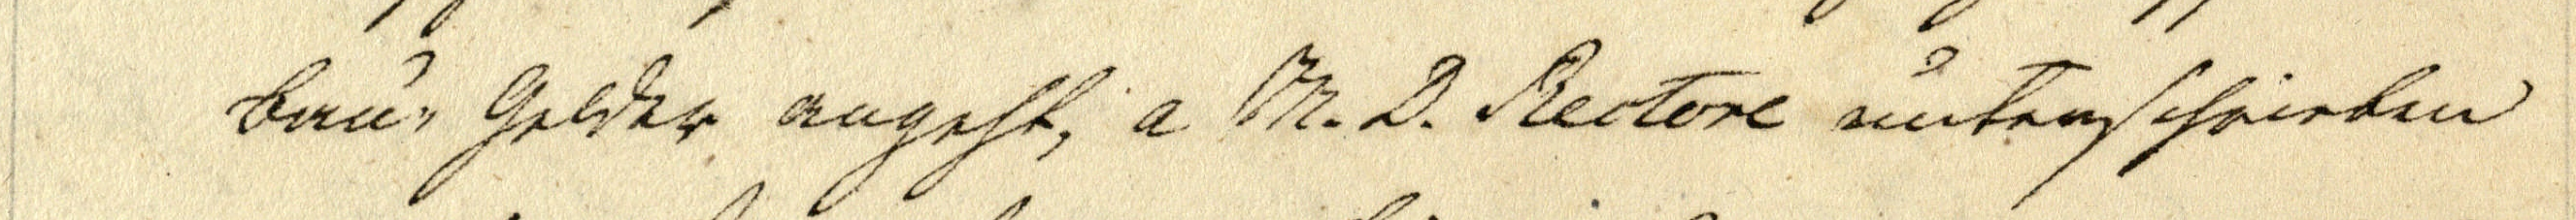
bau-Gelder angeht, a M. D. Rectore unterschrieben
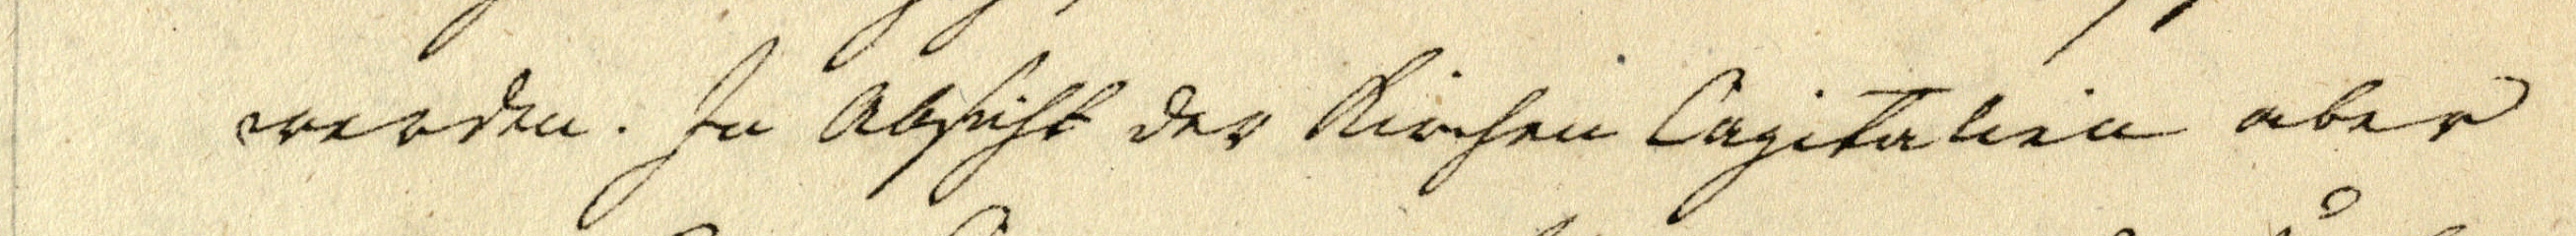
werden. In Absicht der Kirchen Capitalien aber
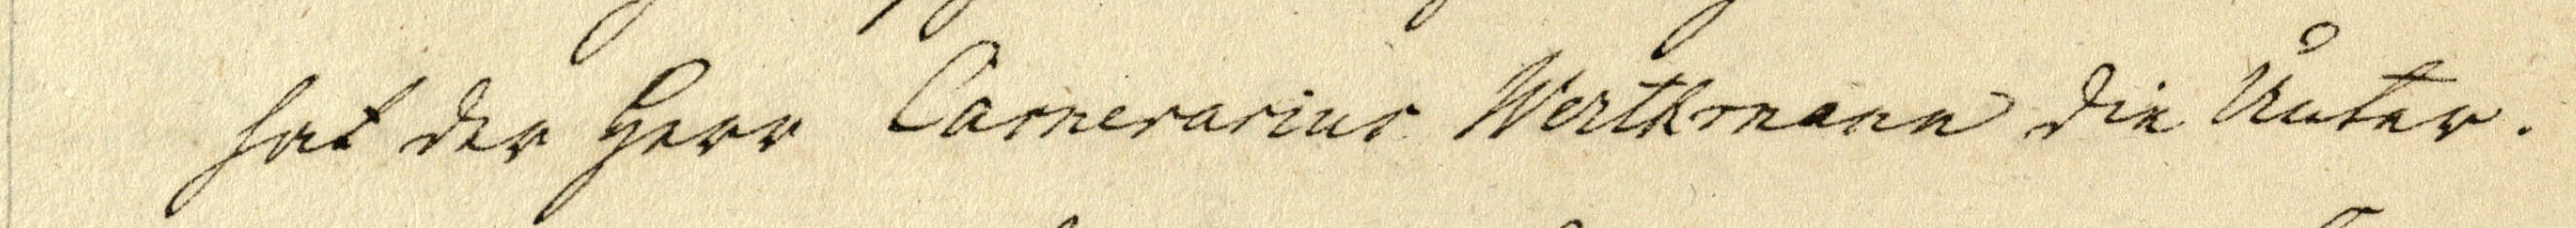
hat der Herr Camerarius Werthmann die Unter¬
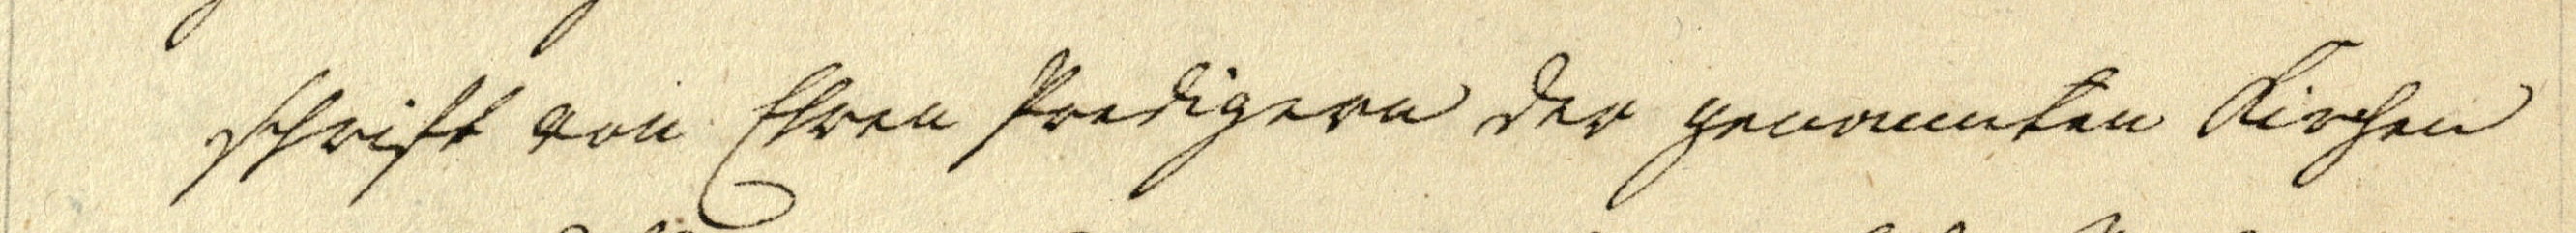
schrift von Ehren Predigern der genannten Kirchen
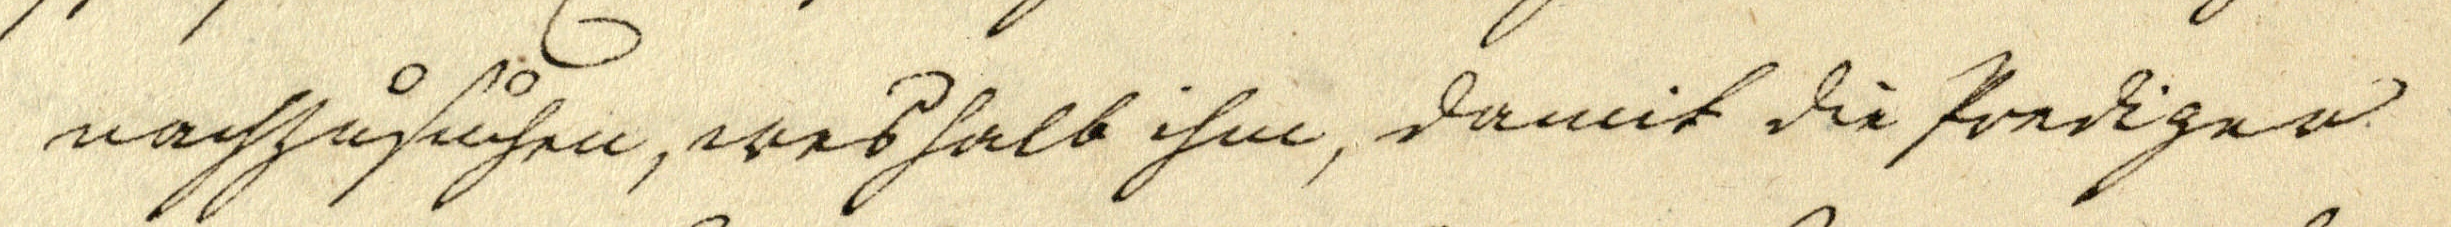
nachzusuchen, weshalb ihm, damit die Prediger
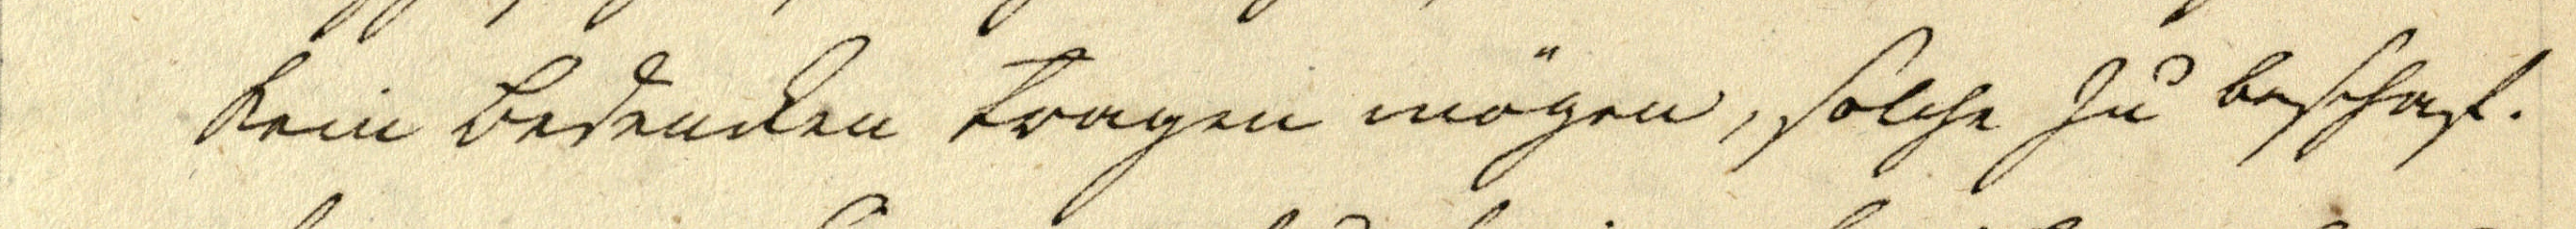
kein Bedencken tragen mögen, solche zu beschaf¬
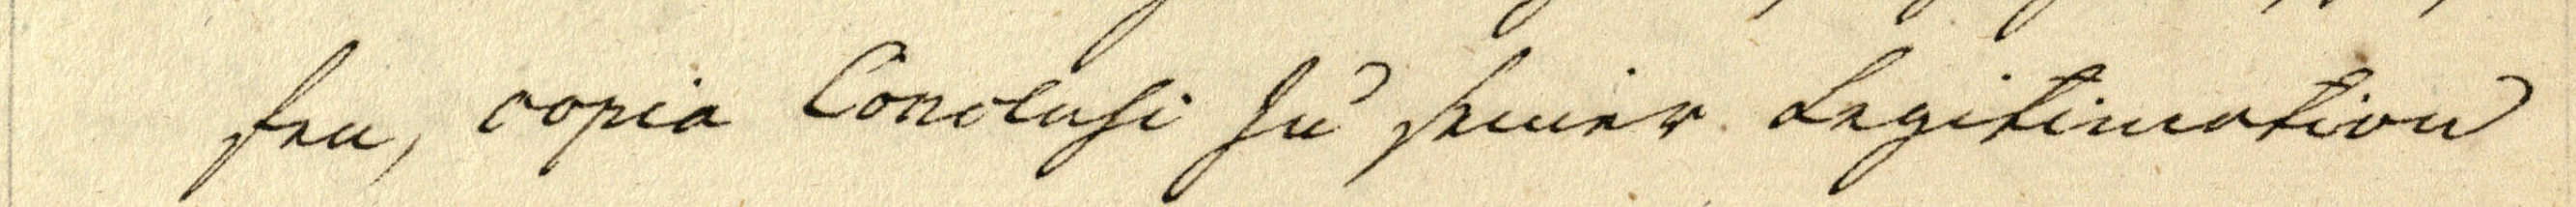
fen, copia Conclusi zu seiner Legitimation
